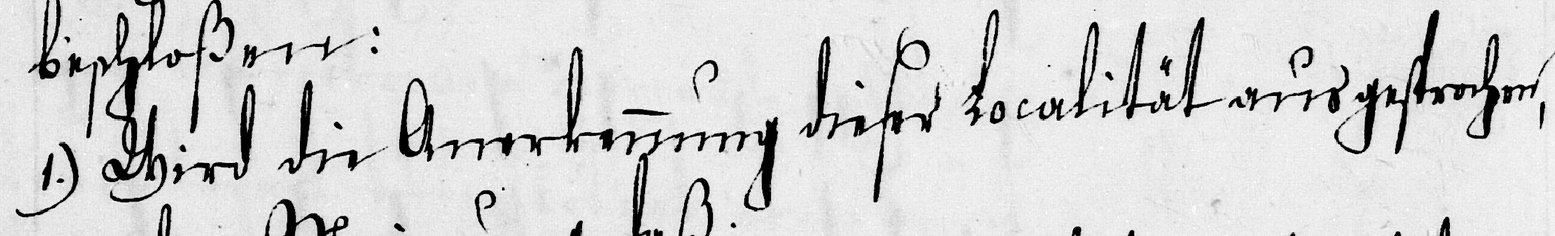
1.) Wird die Anerkennung dieser Localität ausgesproch¬
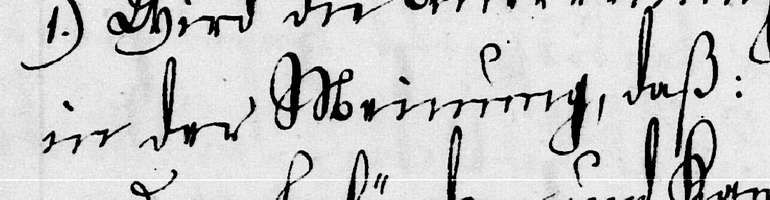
in der Meinung, daß:
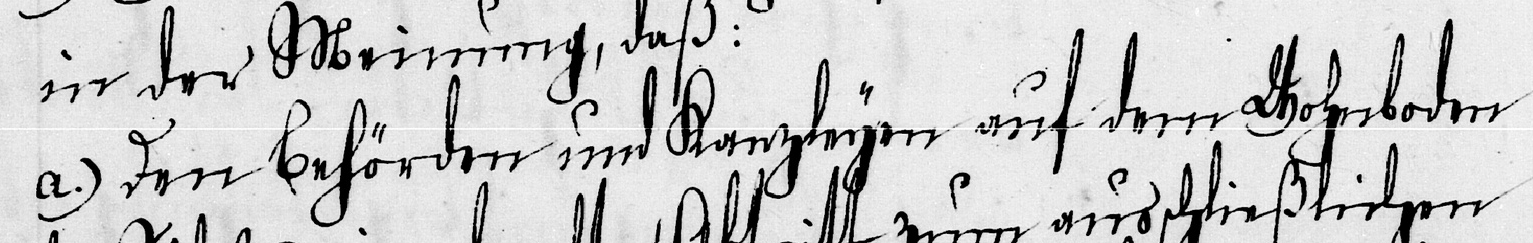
a.) Den Behörden und Kanzleyen auf dem Wohnboden
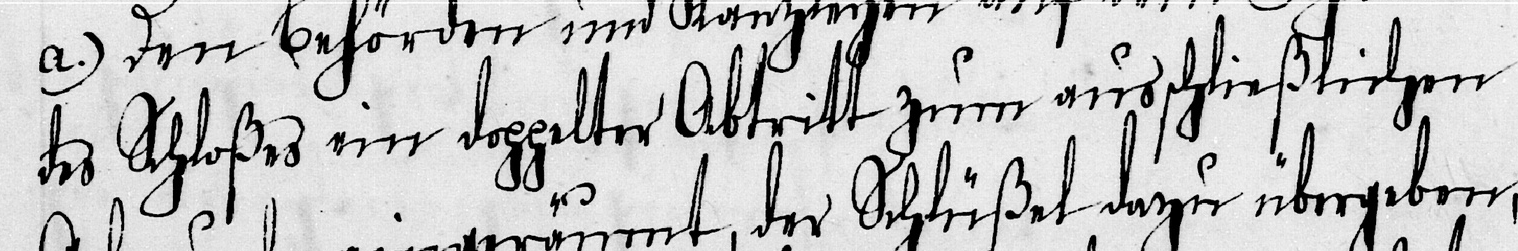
des Schloßes ein doppelter Abtritt zum ausschließlichen
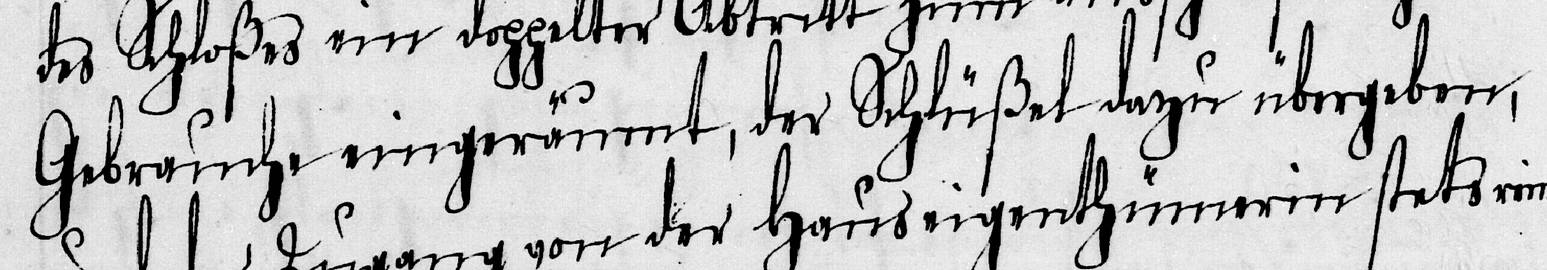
Gebrauche eingeräumt, der Schlüßel dazu übergeben,
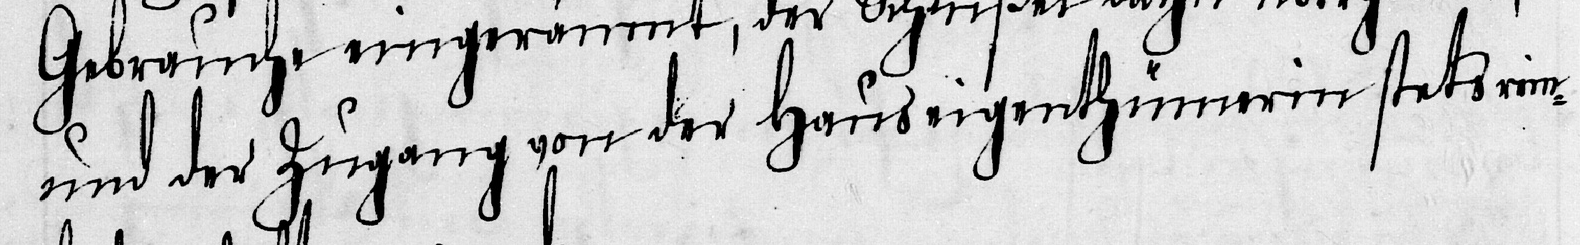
und der Zugang von der Hauseigenthümerin stets rein¬
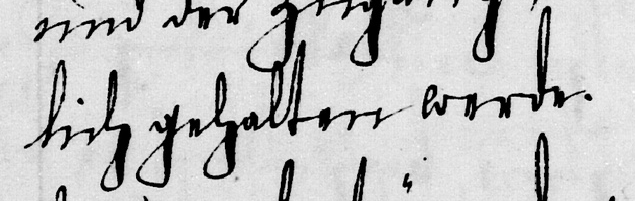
lich gehalten werde.
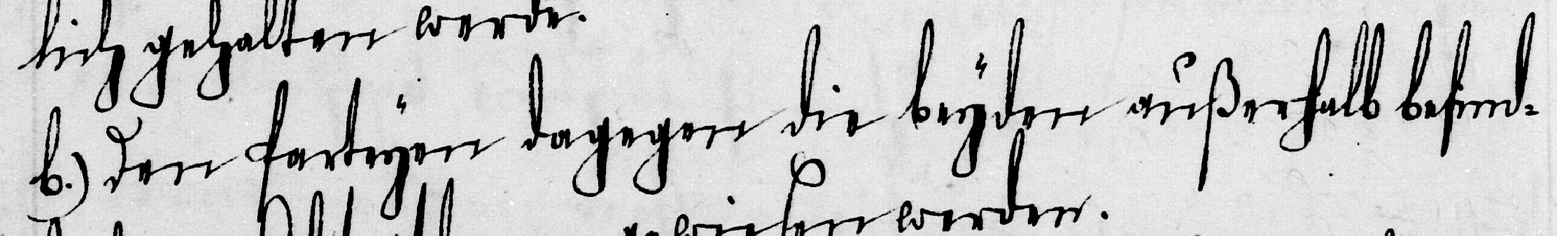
b.) Den Parteyen dagegen die beyden außerhalb befin¬
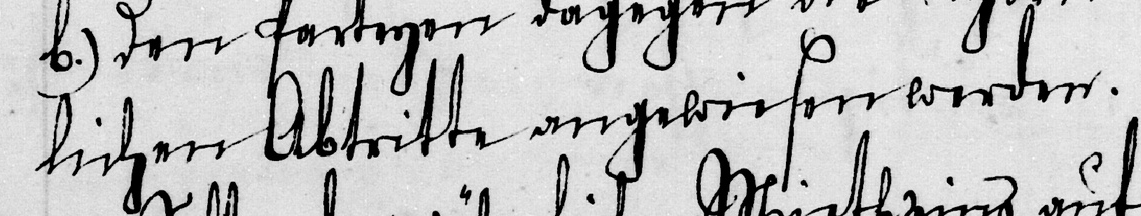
dlichen Abtritte angewiesen werden.
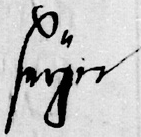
sey.
